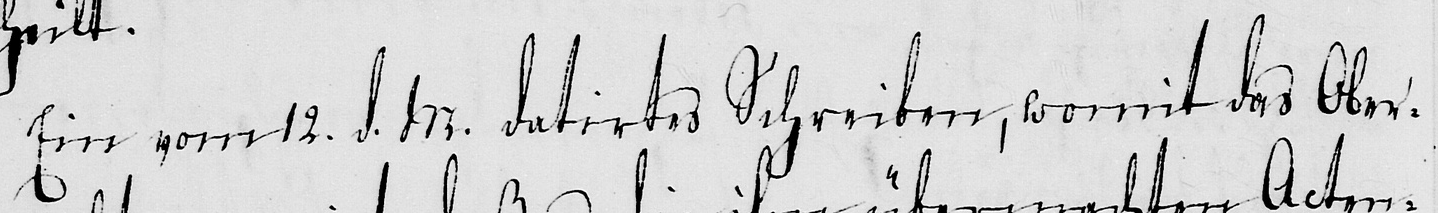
Ein vom 12. d. M. datirtes Schreiben, womit das Ober¬
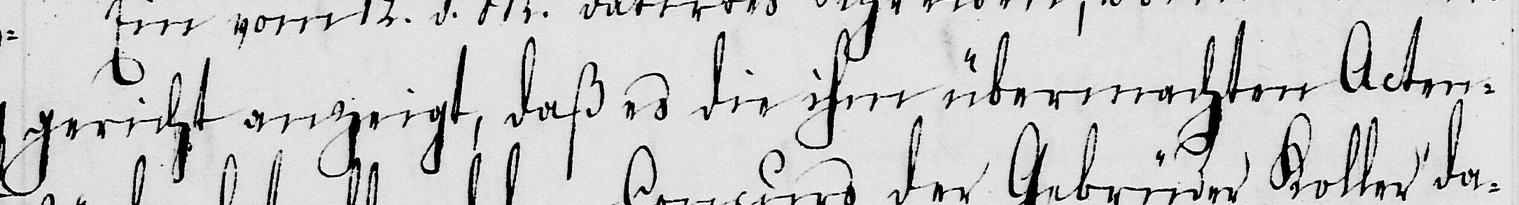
gericht anzeigt, daß es die ihm übermachten Acten¬
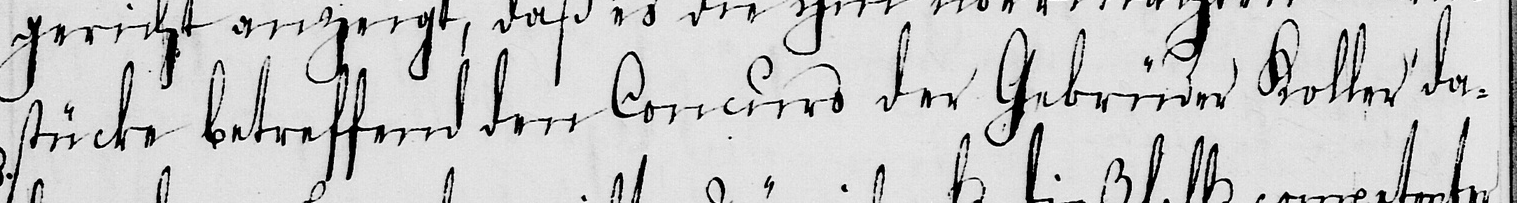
stücke betreffend den Concurs der Gebrüder Koller da¬
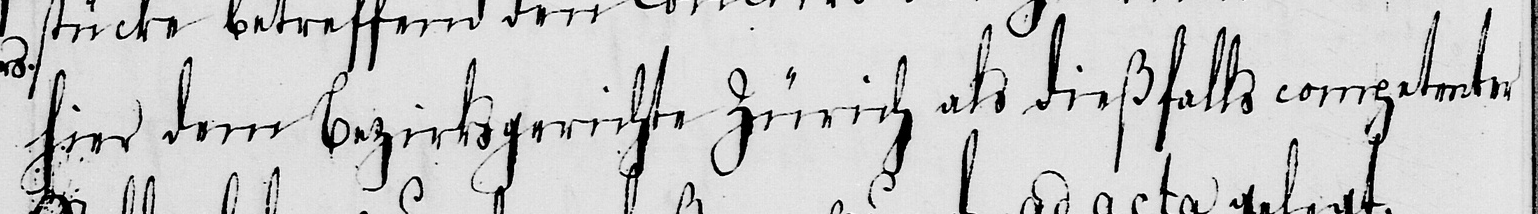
hier dem Bezirksgerichte Zürich als dießfalls competent¬
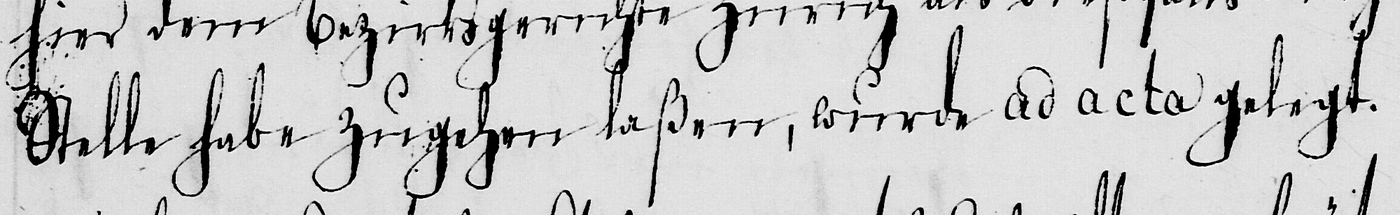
Stelle habe zugehen laßen, wurde ad acta gelgegt.
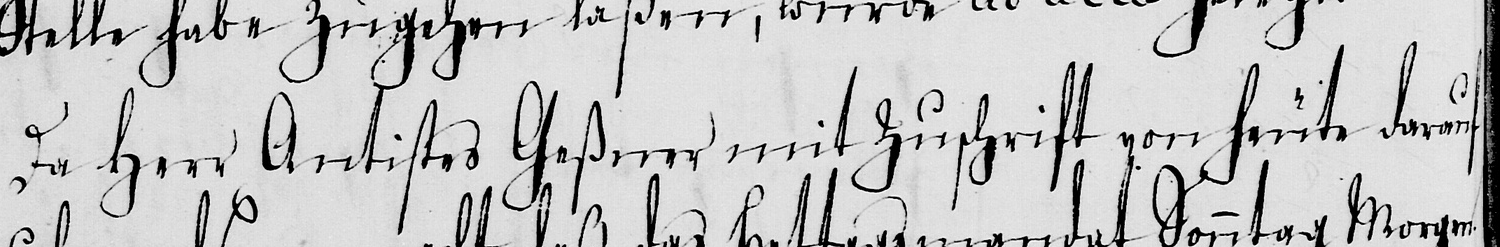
Da Herr Antistes Geßner mit Zuschrift von heute darauf
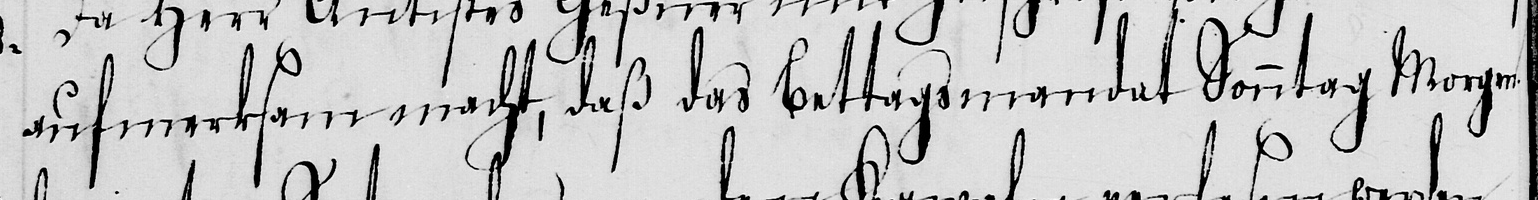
aufmerksam macht, daß das Bettagsmandat Sonntag Morgen
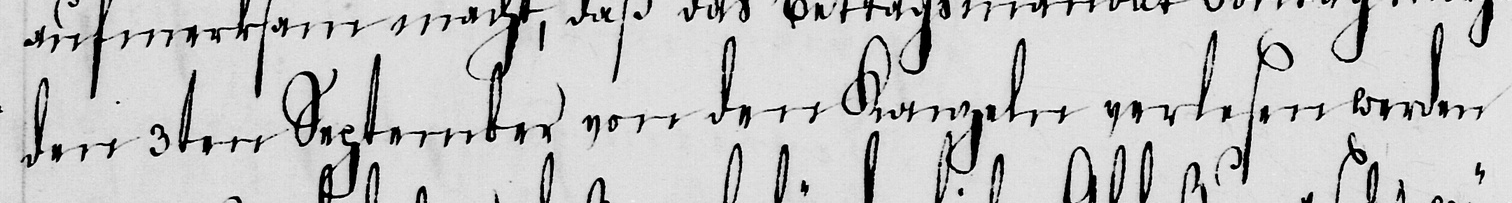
den 3ten September von den Kanzeln verlesen werden
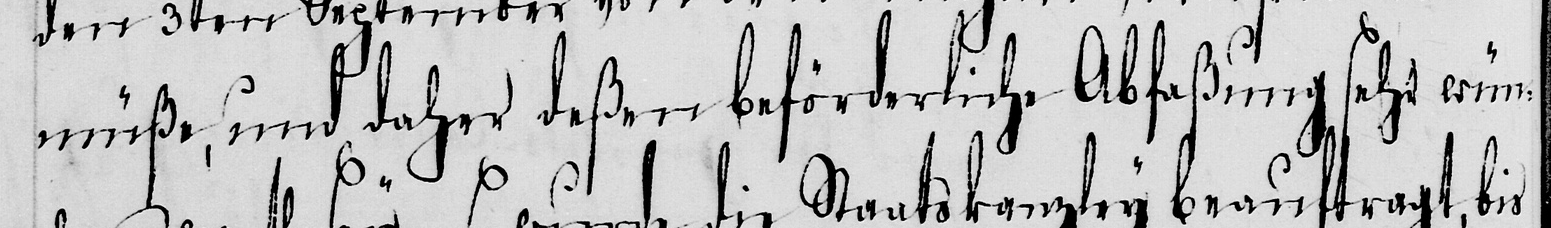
müße, und daher deßen beförderliche Abfaßung sehr wün¬
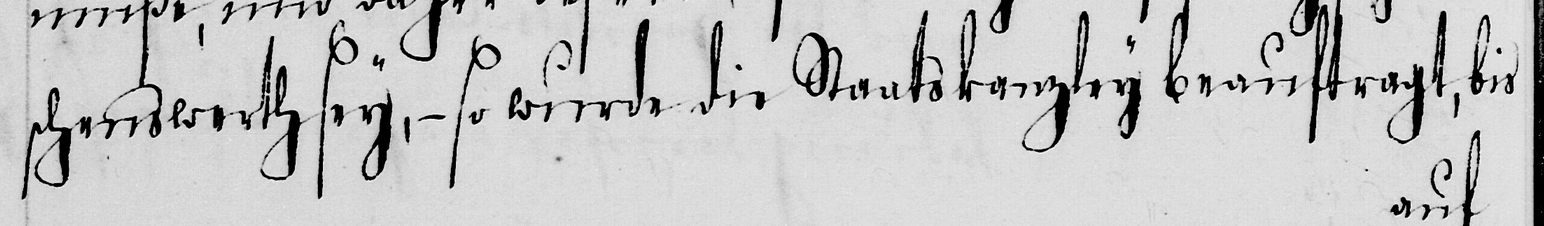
schenswerth sey, – so wurde die Staatskanzley beauftragt, bis
